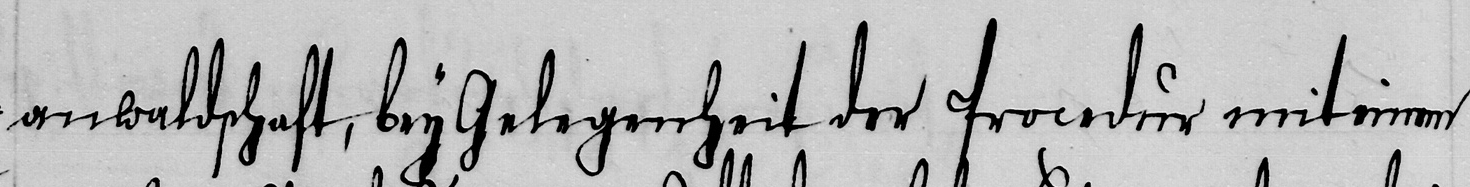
anwaldschaft, bey Gelegenheit der Procedur mit einem
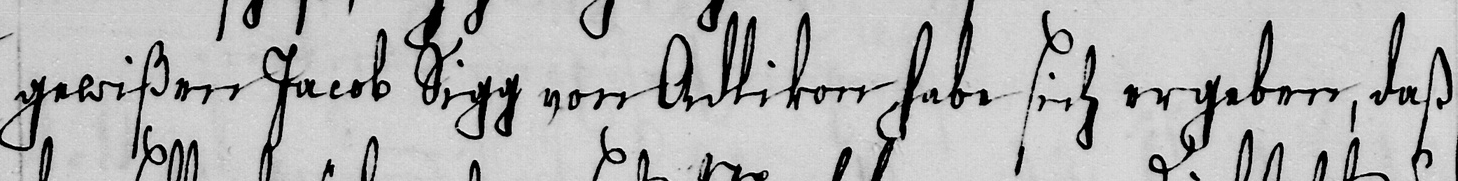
gewißen Jacob Sigg von Adlikon habe sich ergeben, daß
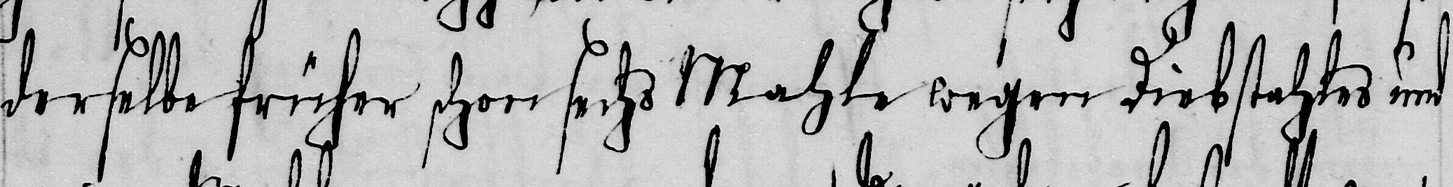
derselbe früher schon sechs Mahle wegen Diebstahles und
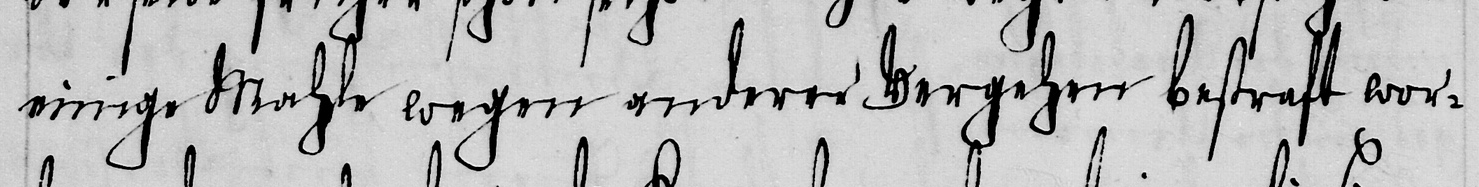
einige Mahle wegen anderer Vergehen bestraft wor¬
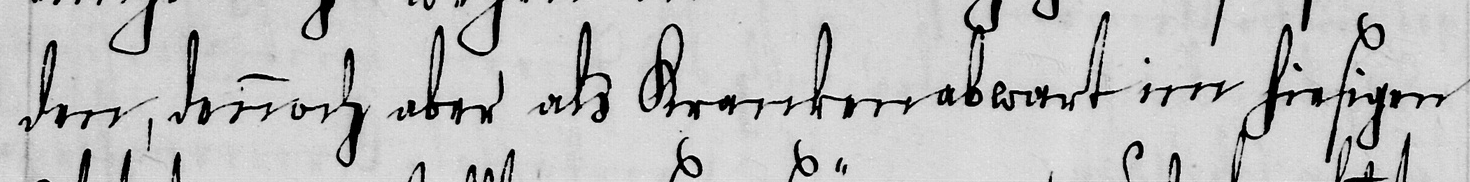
den, dennoch aber als Krankenabwart im hiesigen
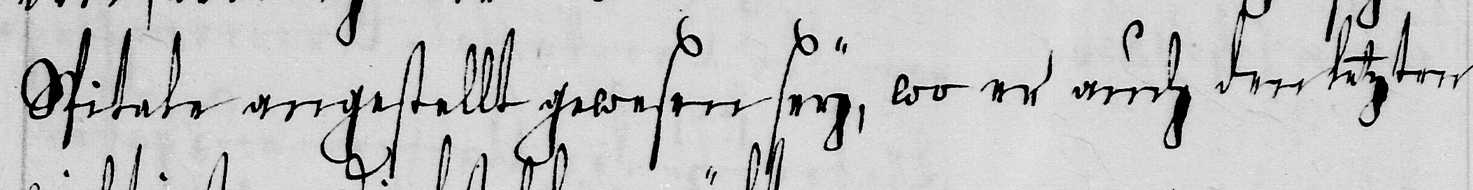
Spitale angestellt gewesen sey, wo er auch den letzten
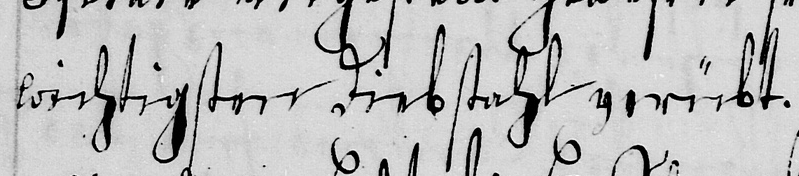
wichtigen Diebstahl verübt.
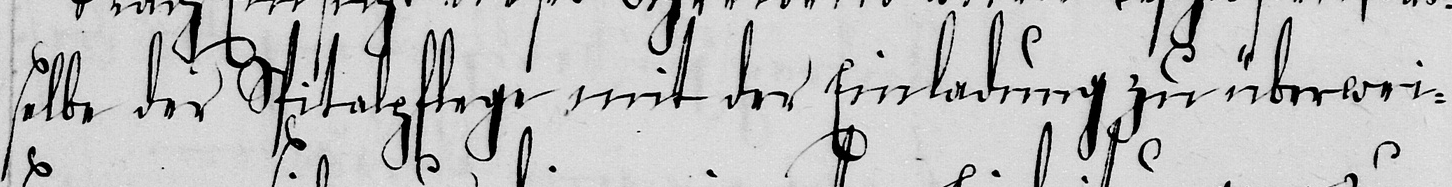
selbe der Spitalpflege mit der Einladung zu überwei¬
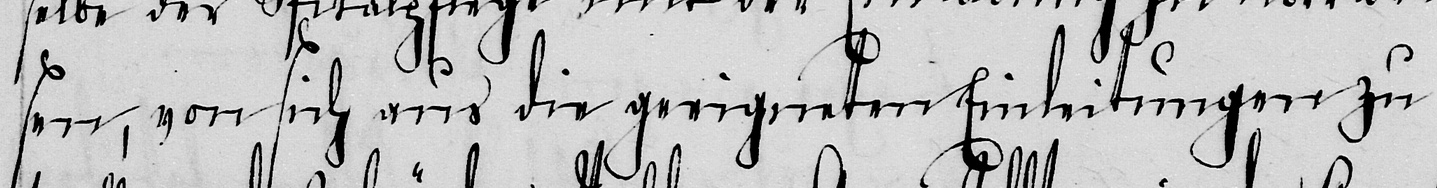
sen, von sich aus die geeigneten Einleitungen zu
